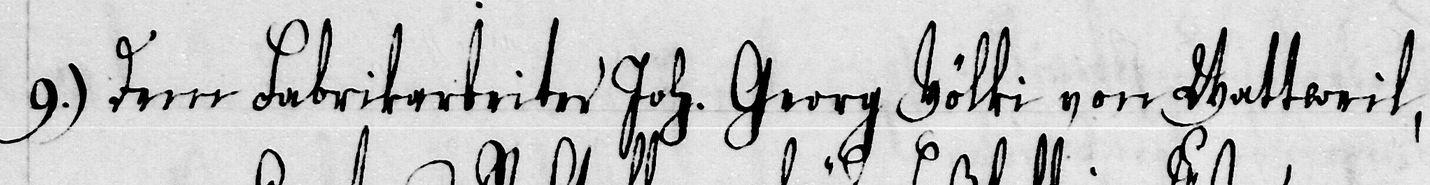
9.) Dem Fabrikarbeiter Joh. Georg Völki von Wattweil,
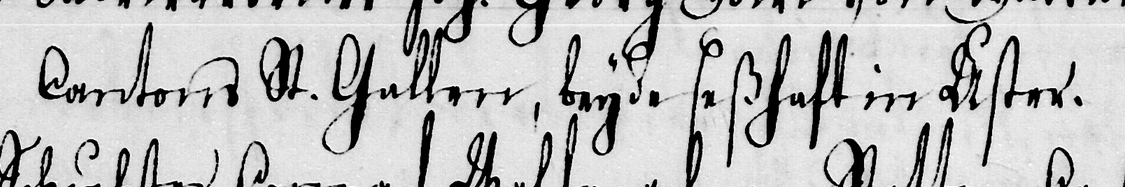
Cantons St. Gallen, beyde seßhaft in Uster.
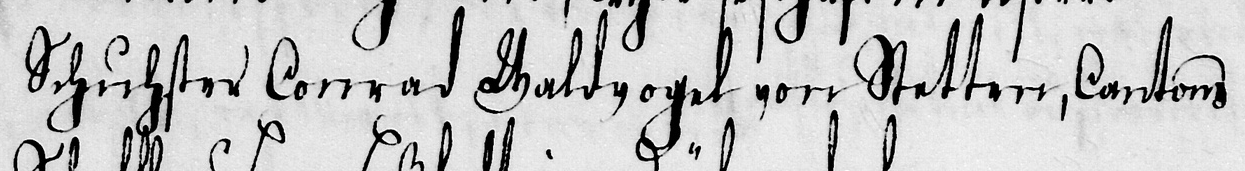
Schuhster Conrad Waldvogel von Stetten, Cantons
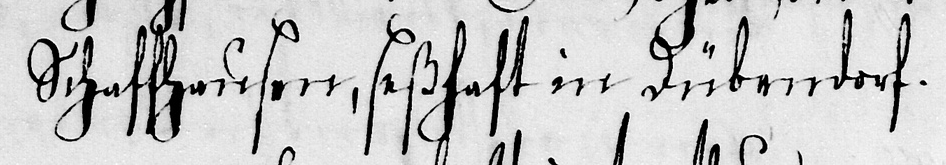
Schaffhausen, seßhaft in Dübendorf.
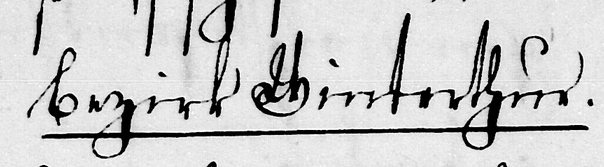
Bezirk Winterthur.
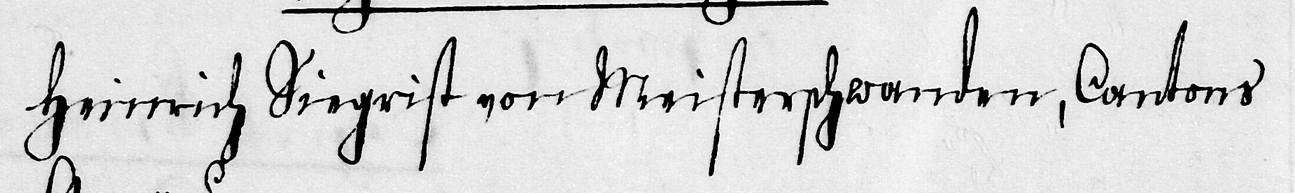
Heinrich Siegrist von Meisterschwanden, Cantons
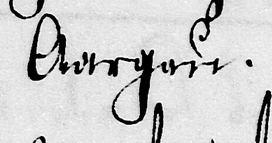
Aargau.
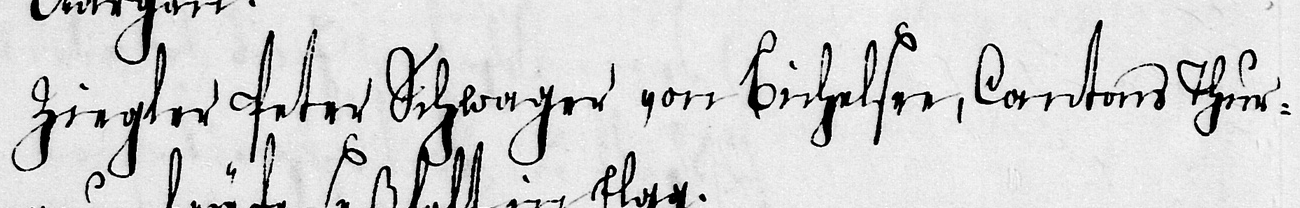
Ziegler Peter Schwager von Bichelsee, Cantons Thur¬
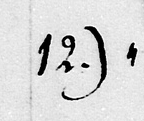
12.)
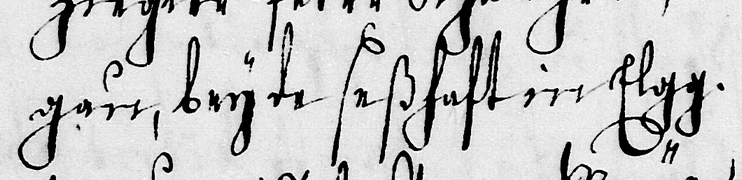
gau, beyde seßhaft in Elg¬
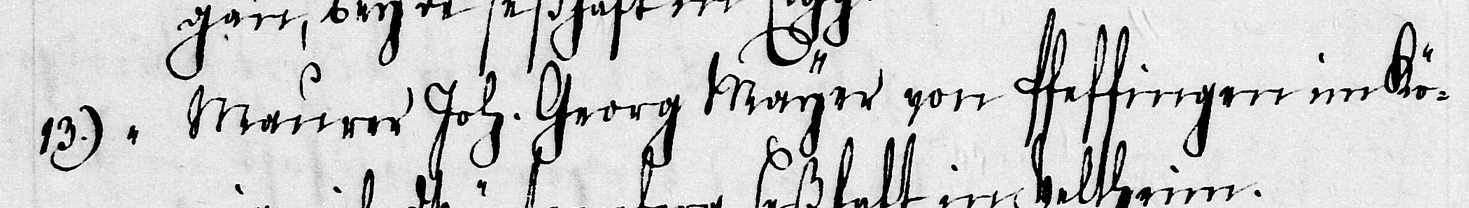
13.) “ Maurer Joh. Georg Mayer von Pfeffingen im Kö¬
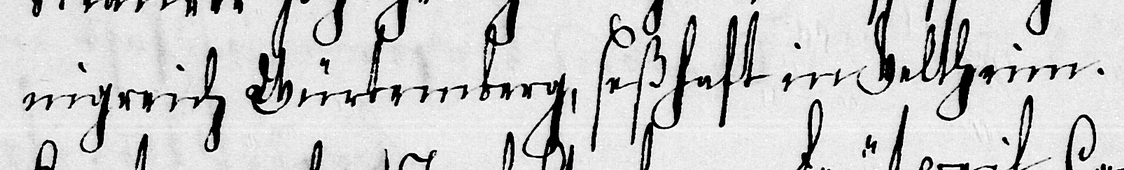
nigreich Würtemberg, seßhaft in Veltheim.
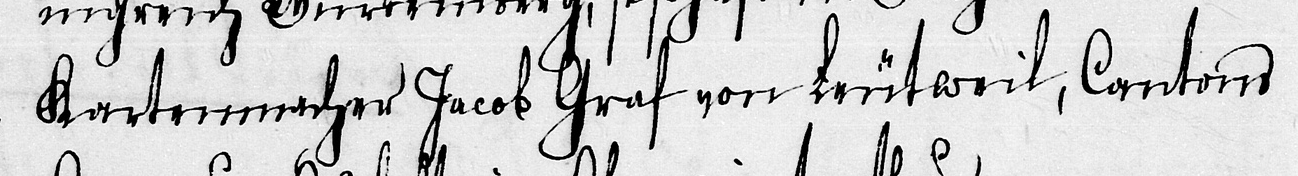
Kartenmacher Jacob Graf von Leutweil, Cantons
